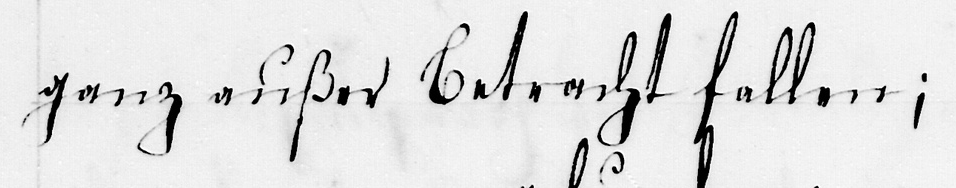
ganz außer Betracht fallen;
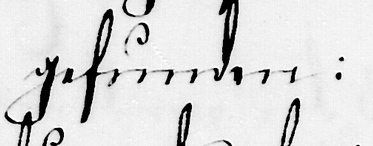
gefunden:
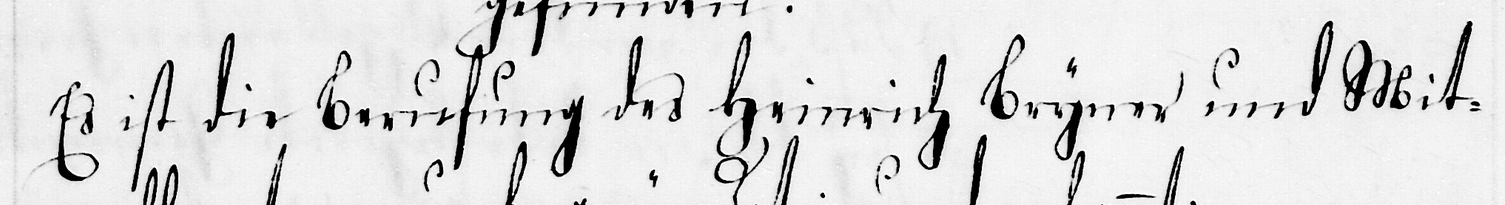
Es ist die Berufung des Heinrich Bryner und Mit¬
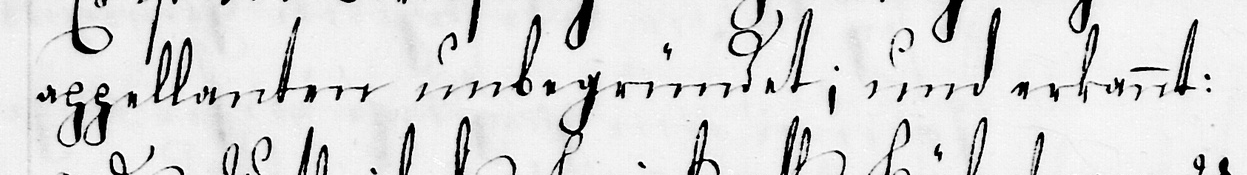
appellanten unbegründet; und erkannt:
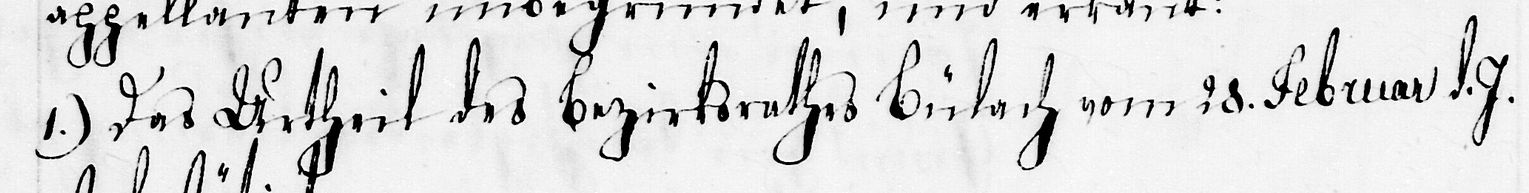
1.) Das Urtheil des Bezirksrathes Bülach vom 28. Februar d. J.
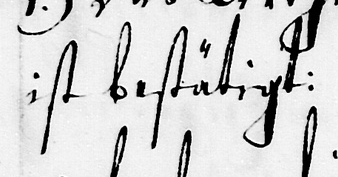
st bestätigt:
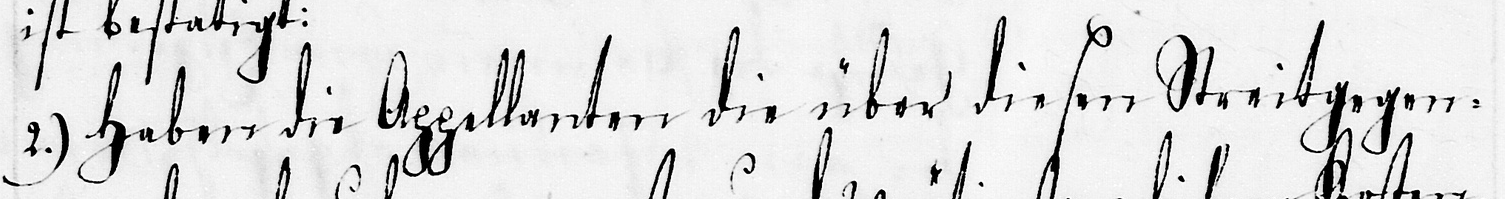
2.) Haben die Appellanten die über diesen Streitgegen¬
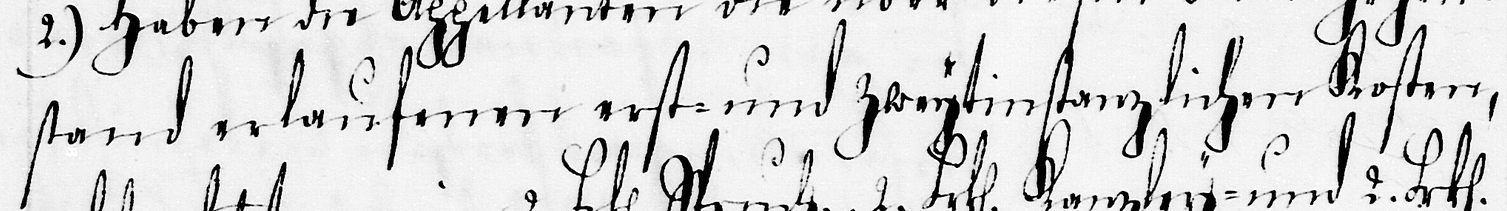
stand erlaufenen erst- und zweytinstanzlichen Kosten,
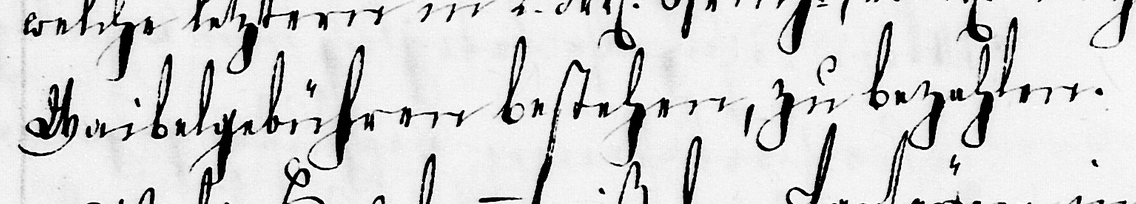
Waibelgebühren bestehen, zu bezahlen.
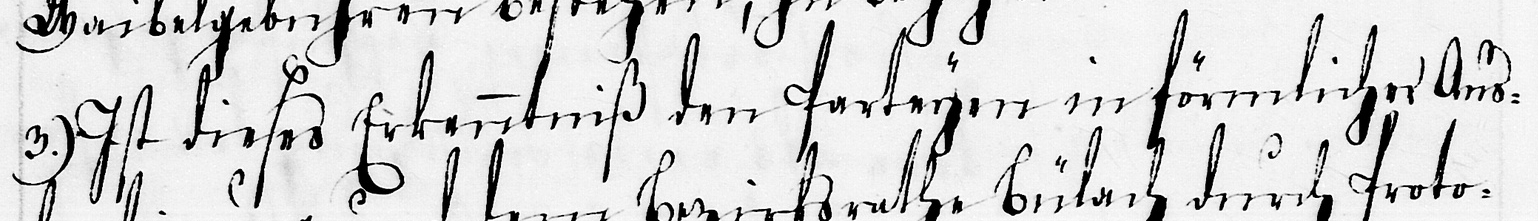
3.) Ist dieses Erkenntniß den Parteyen in förmlicher Aus¬
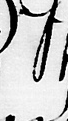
2.
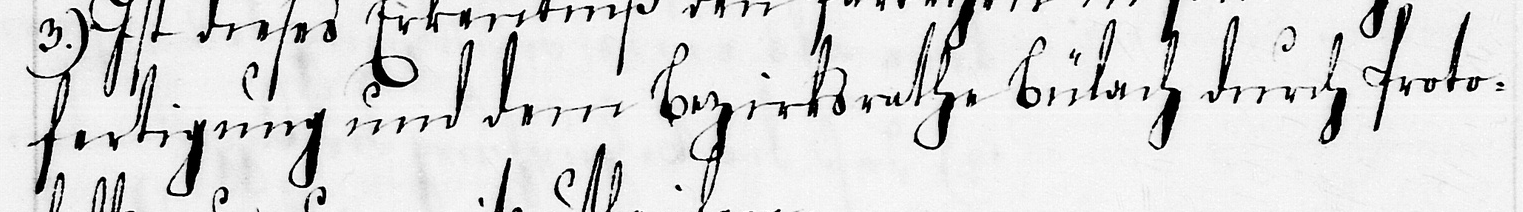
fertigung und dem Bezirksrathe Bülach durch Proto¬
